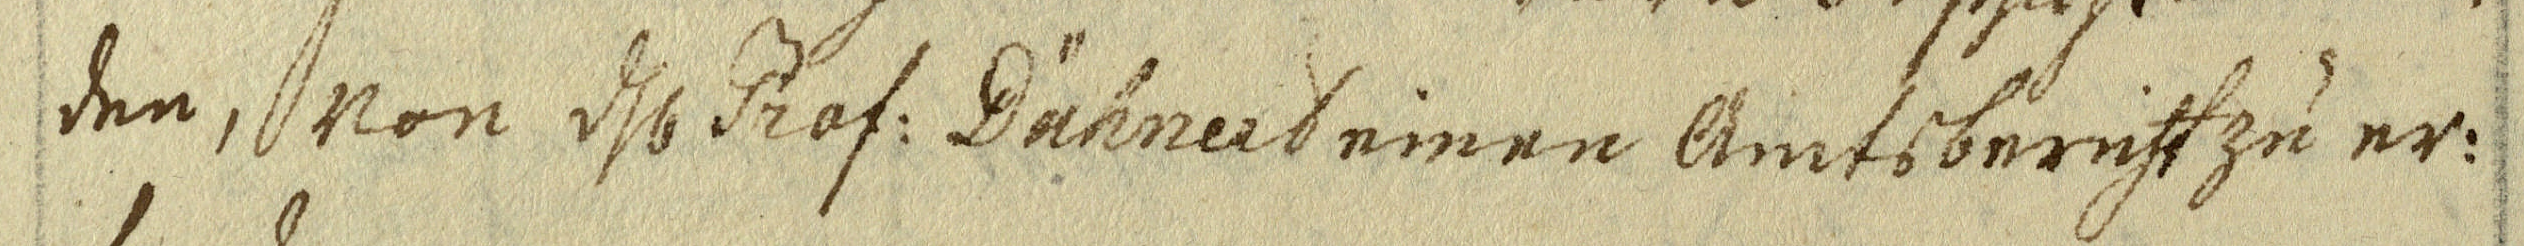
den, von dh Prof. Dähnert einen Amtsbericht zu er¬
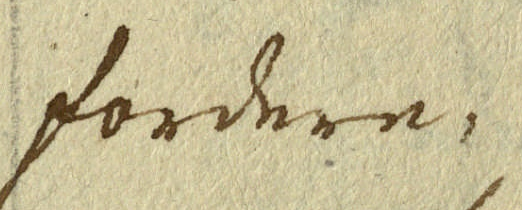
fordern.
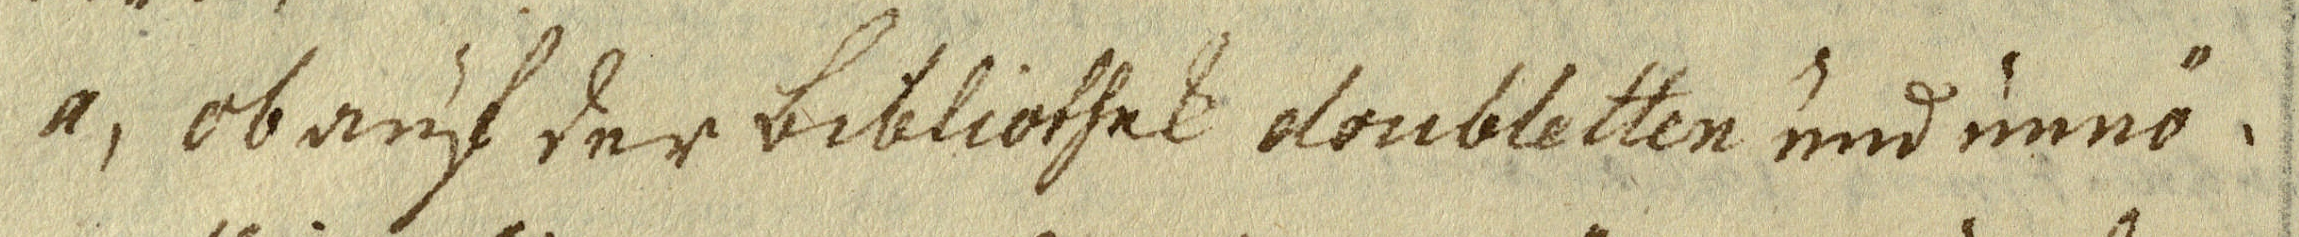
a, ob auf der Bibliothek doubletten und unnö¬
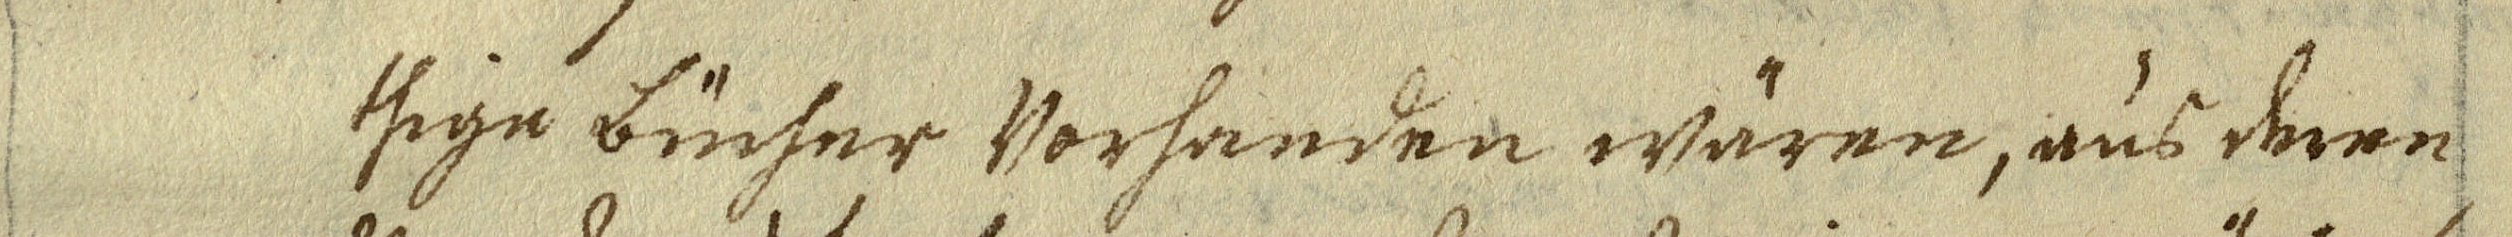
thige Bücher vorhanden wären, aus deren
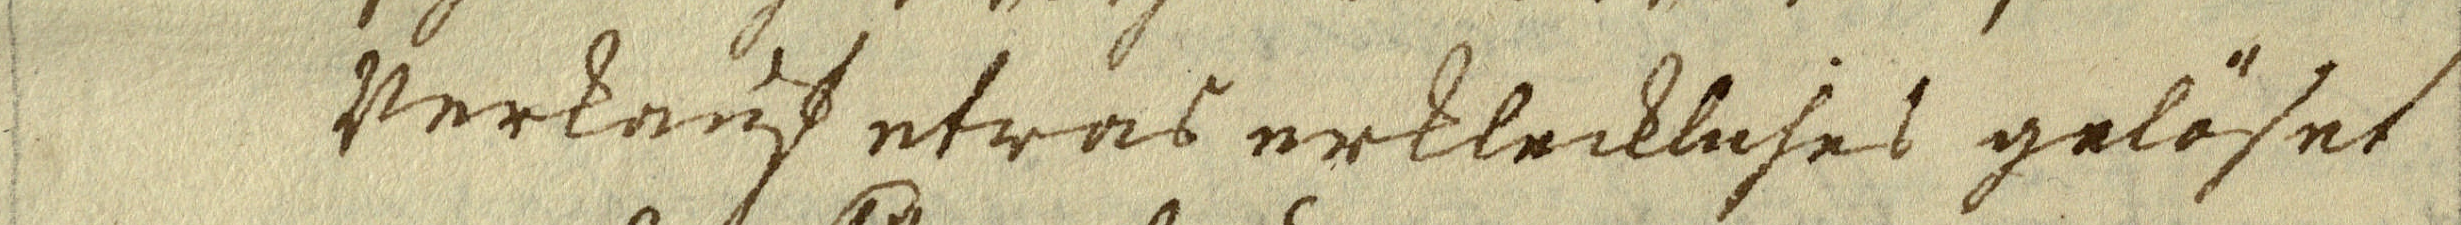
Verkauf etwas erkleckliches gelöset
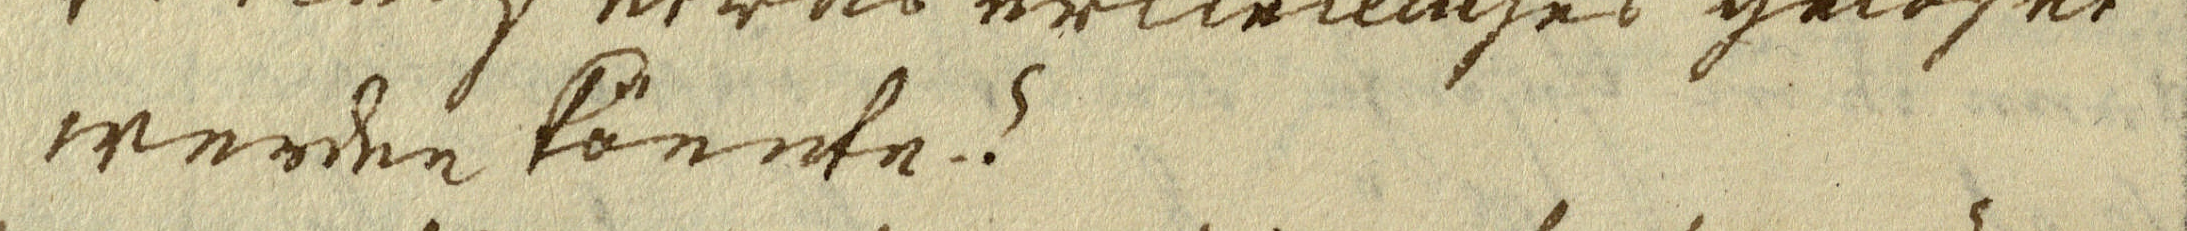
werden könnte?
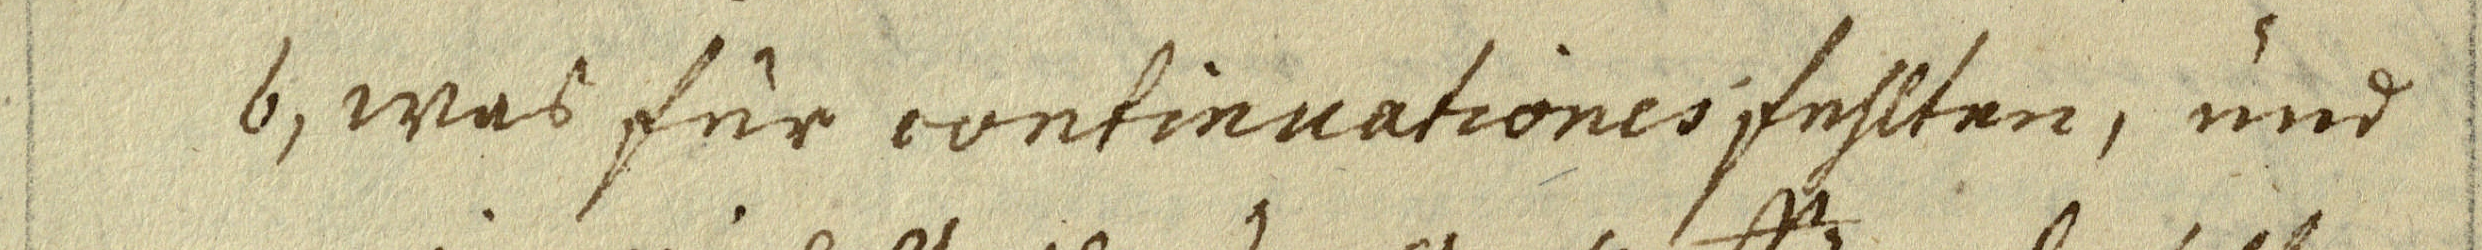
b, was für continuationes fehlten, und
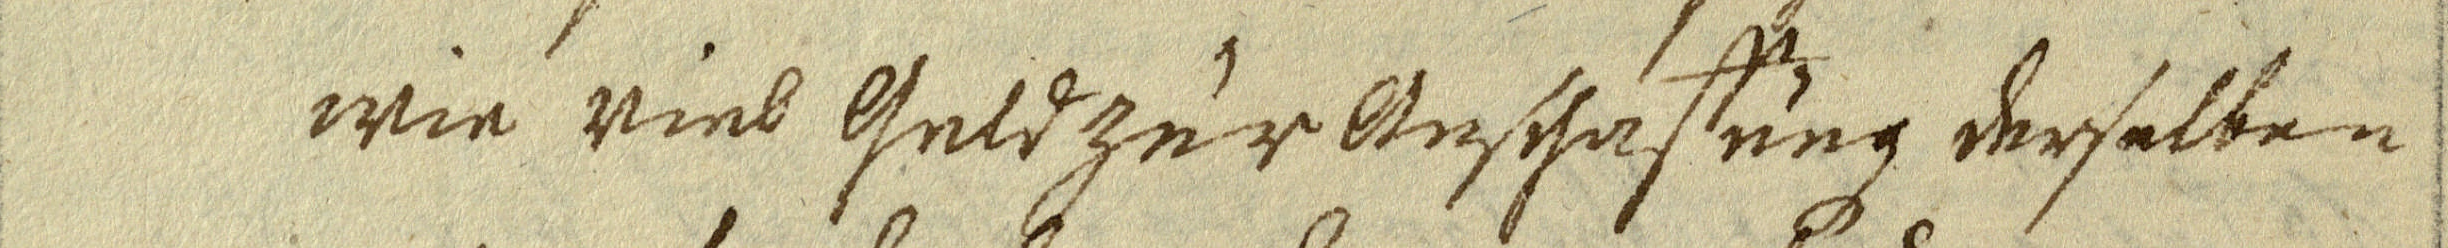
wie viel Geld zur Anschaffung derselben
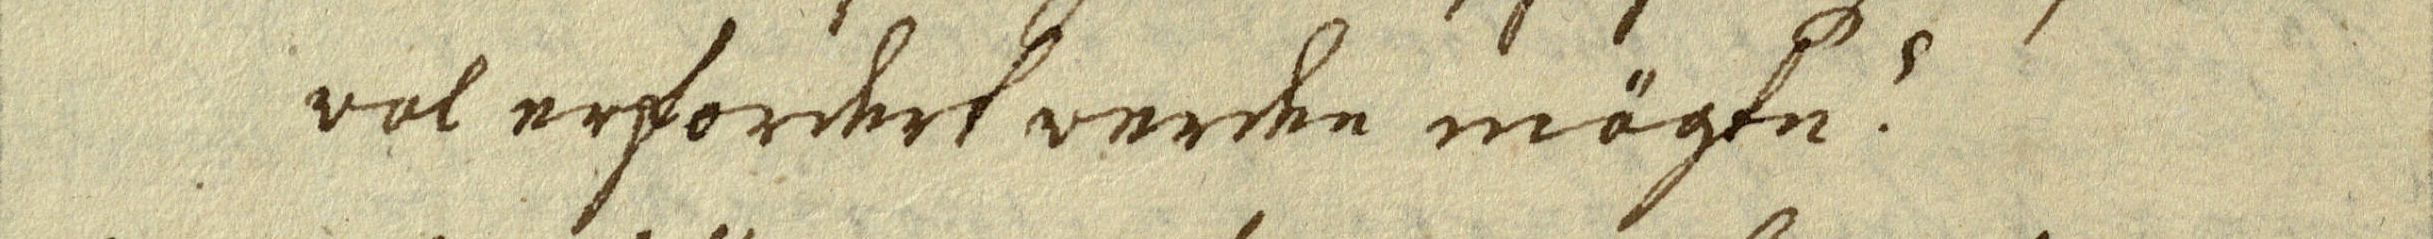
wol erfordert werden mögte?
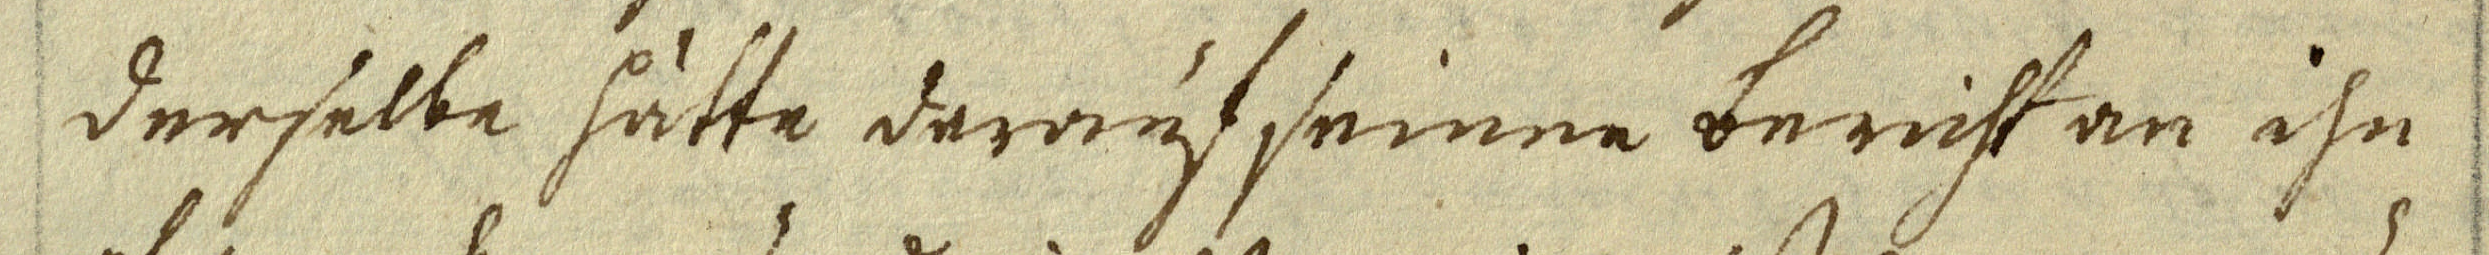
Derselbe hätte darauf seinen Bericht an ihn
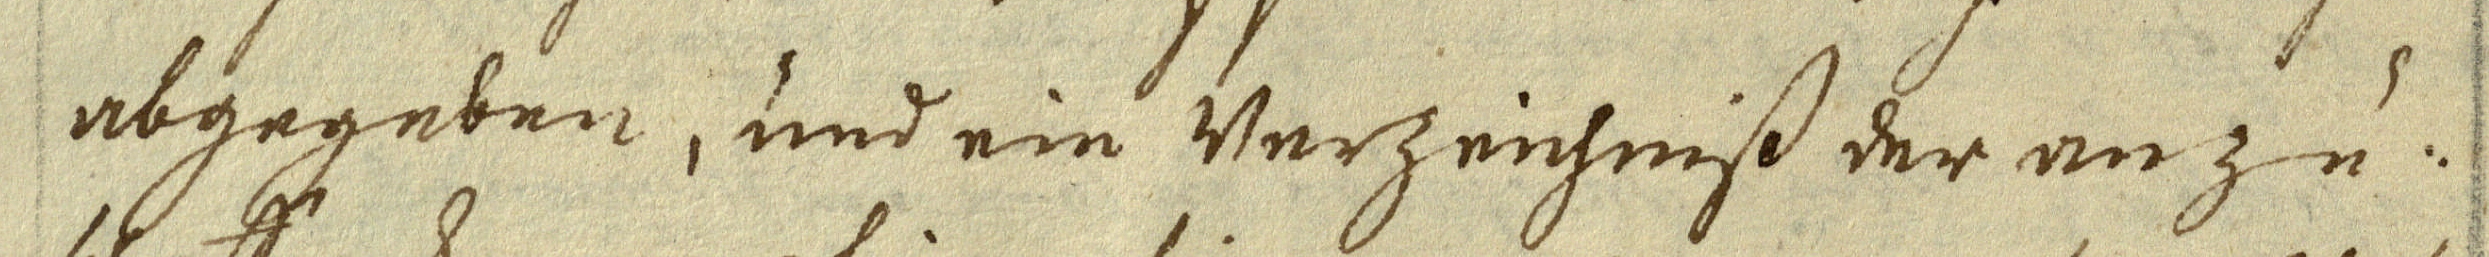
abgegeben, und ein Verzeichniß der anzu¬
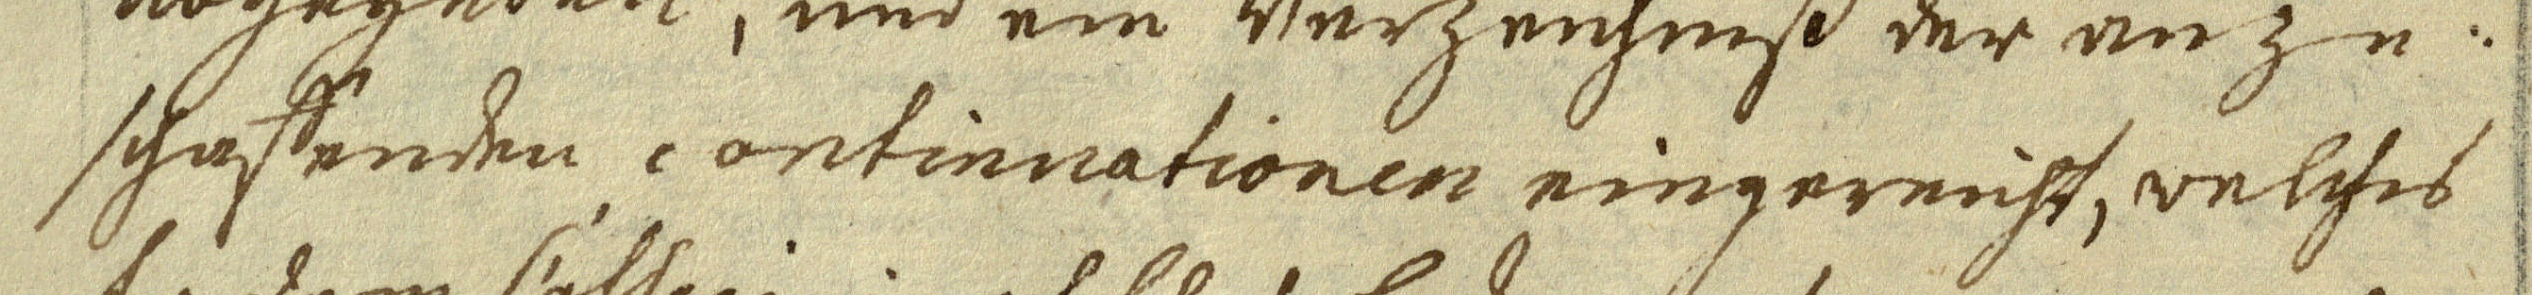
schaffenden continuationen eingereicht, welches
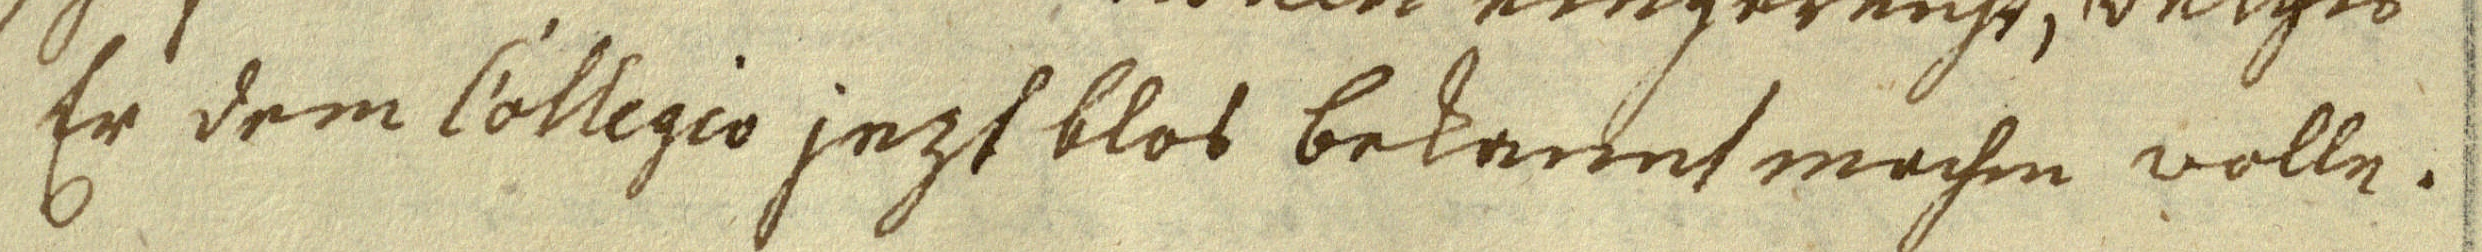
Er dem Collegio jezt blos bekannt machen wolle.
